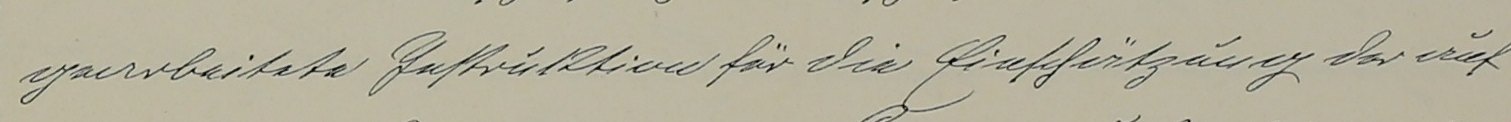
gearbeitete Instruktion für die Einschätzung der auf
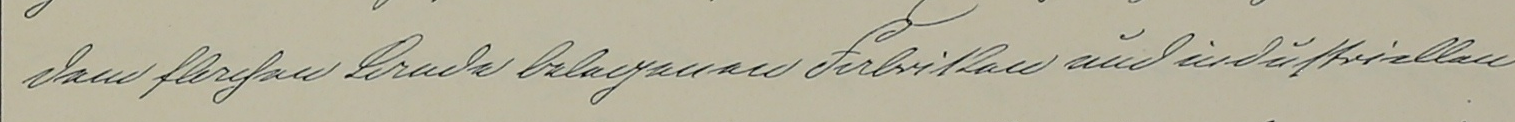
dem flachen Lande belegenen Fabriken und industriellen
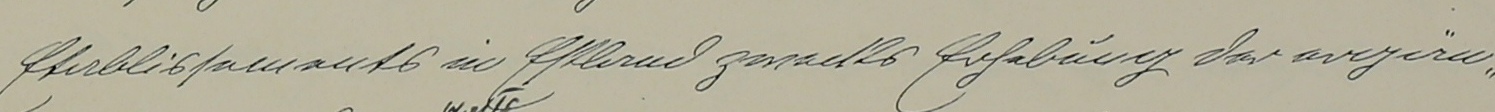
Etablissements in Estland zwecks Erhebung der ergän-
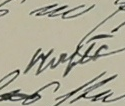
schafts
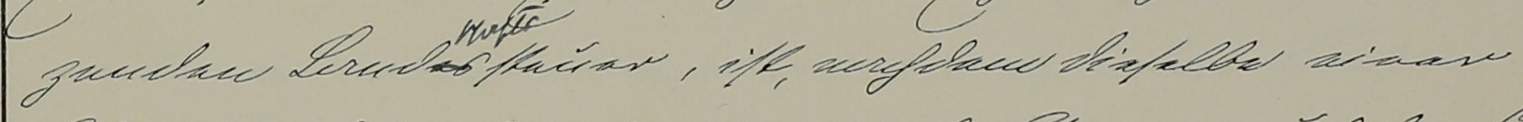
zenden Landessteuer, ist, nachdem dieselbe einer
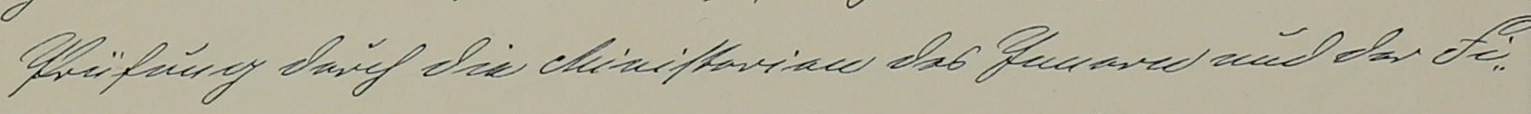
Prüfung durch die Ministerien des Innern und der Fi-
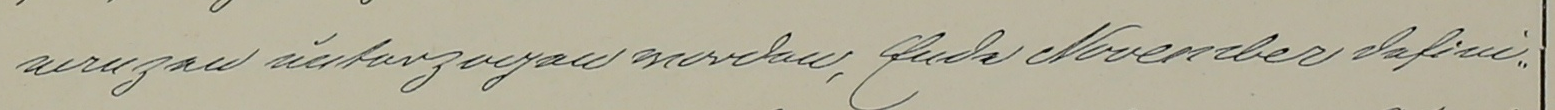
nanzen unterzogen worden, Ende November defini-
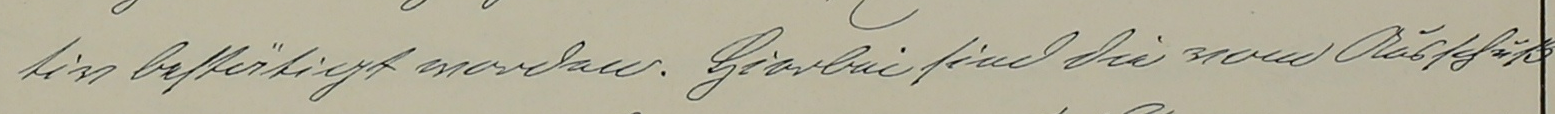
tiv bestätigt worden. Hierbei sind die vom Ausschuß
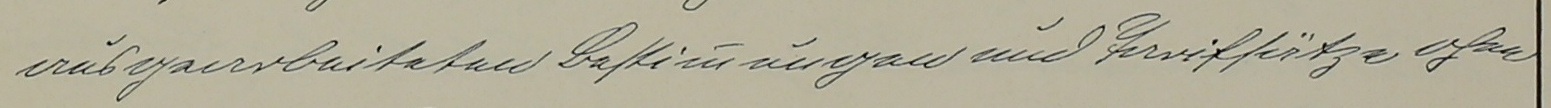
ausgearbeiteten Bestimmungen und Tarifsätze ohne
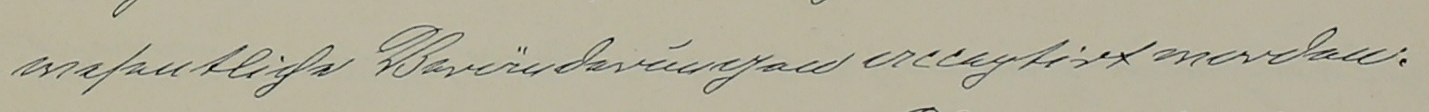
wesentliche Veränderungen acceptiert worden. –
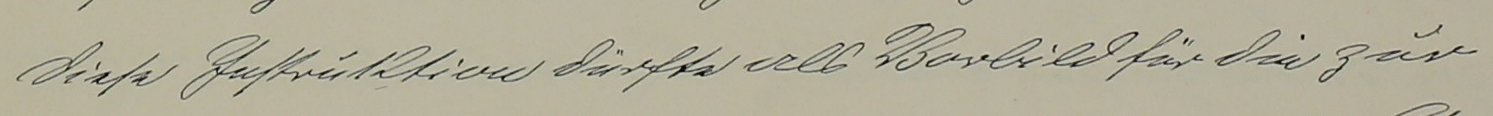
Diese Instruktion dürfte als Vorbild für die zur
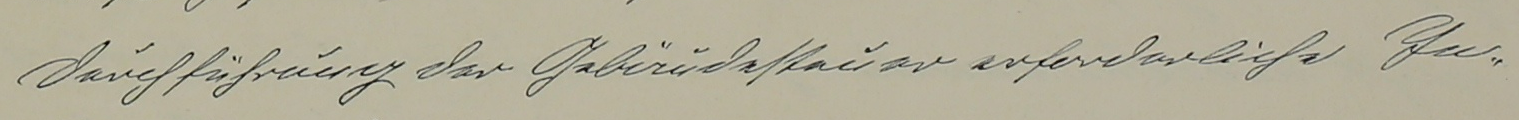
Durchführung der Gebäudesteuer erforderliche In-
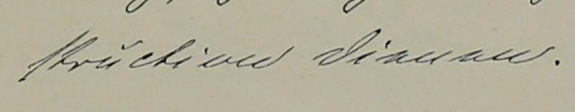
struction dienen.
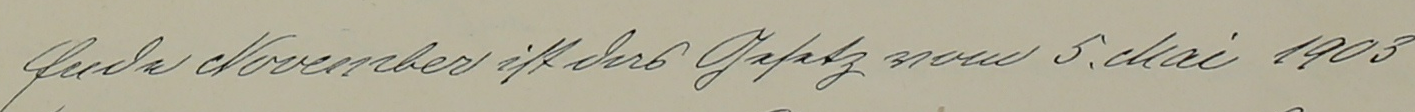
Ende November ist das Gesetz vom 5. Mai 1903
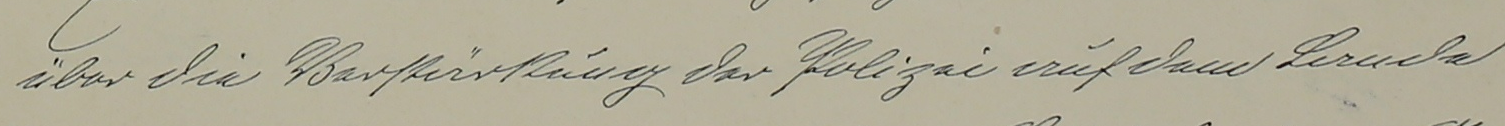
über die Verstärkung der Polizei auf dem Lande
